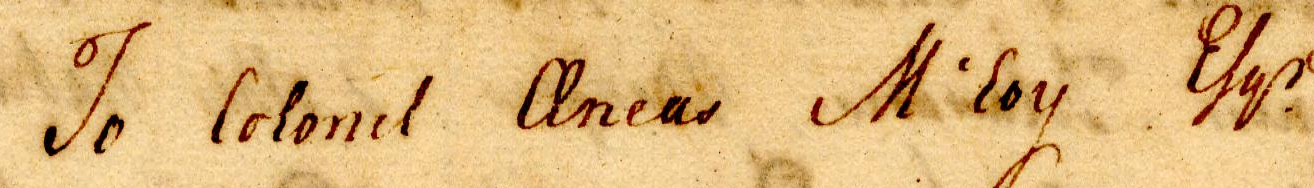To Colonel Aneas M^cCoy Esq^r.
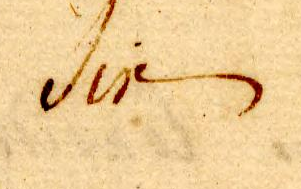Sir
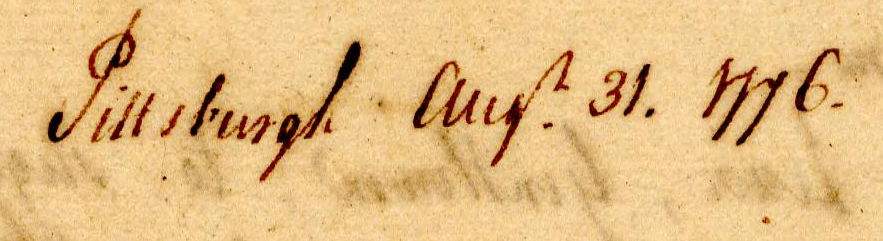Pittsburgh Aug^t. 31. 1776.
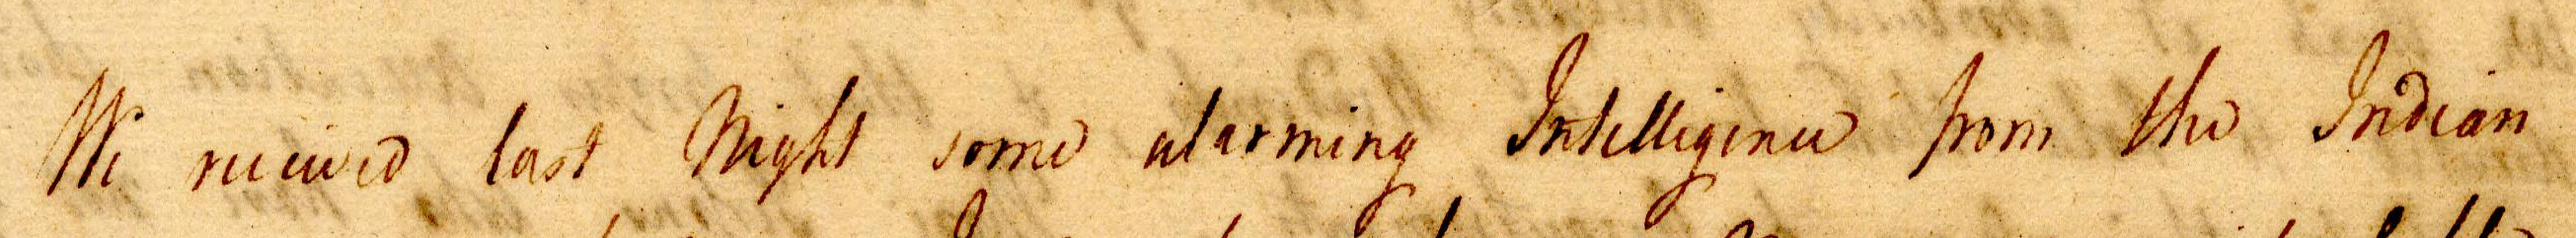We received last Night some alarming Intelligence from the Indian
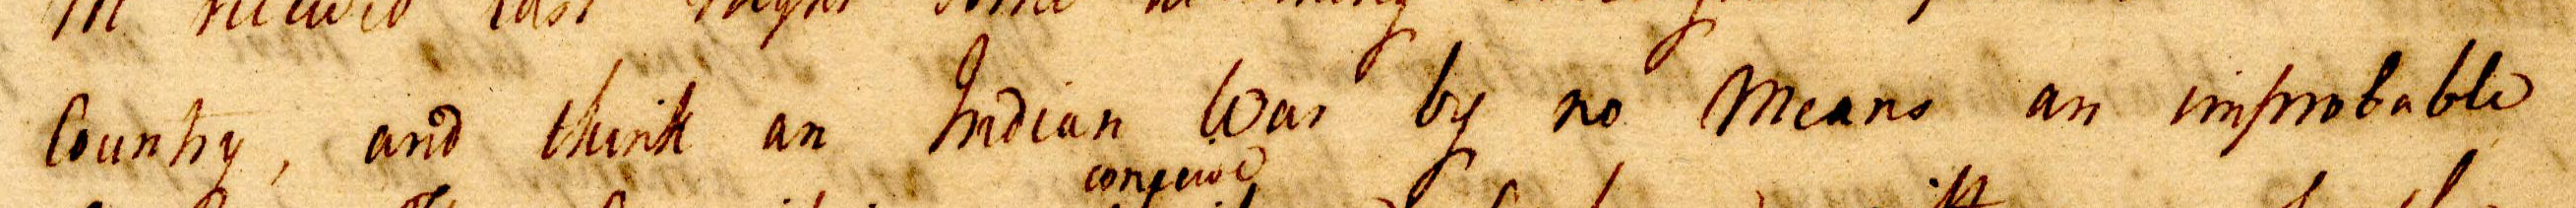Country, and think an Indian War by no means an improbable
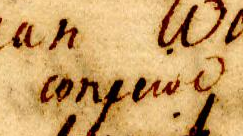conceive
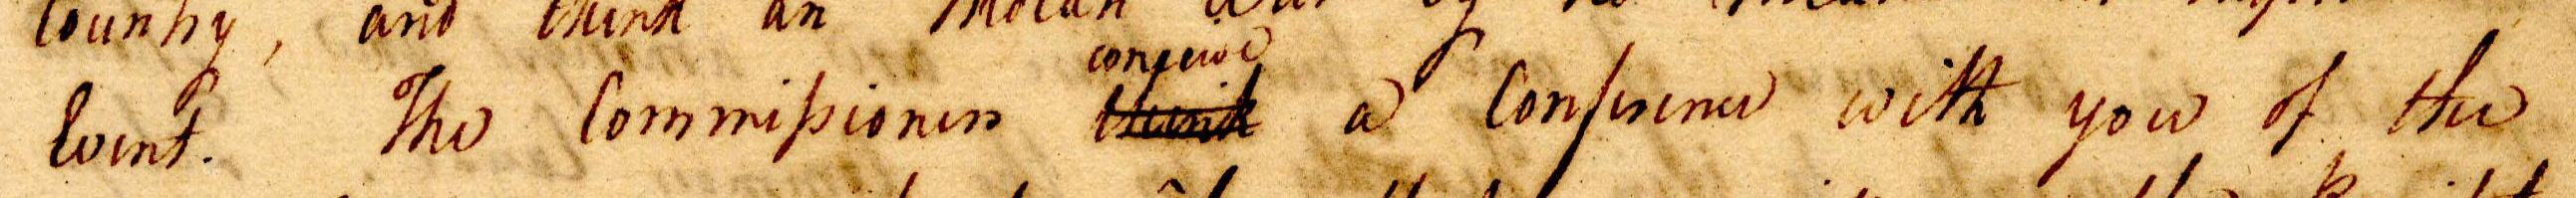event. The Commissioners [think] ^ a Conference with you of the
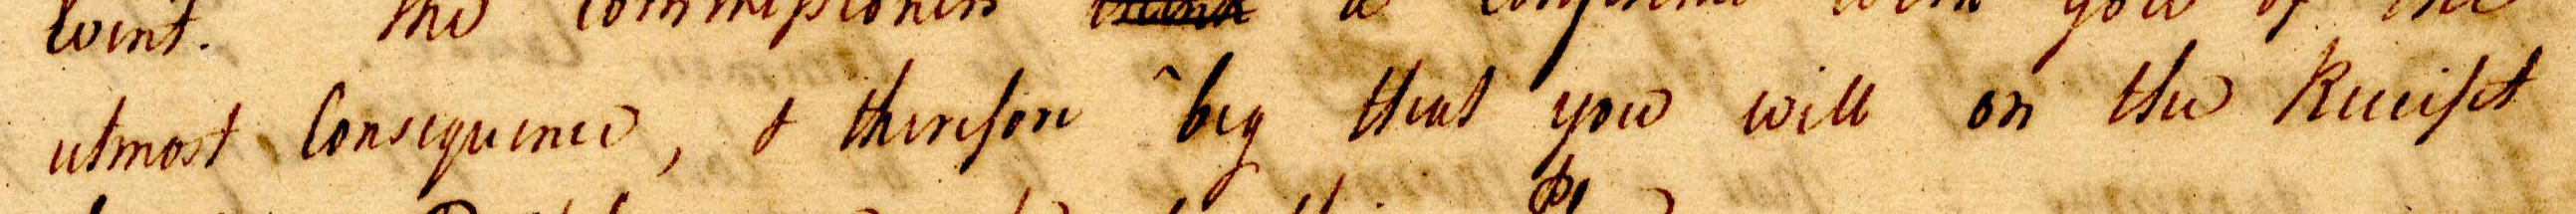utmost Consequence, & therefore beg that you will on the Receipt
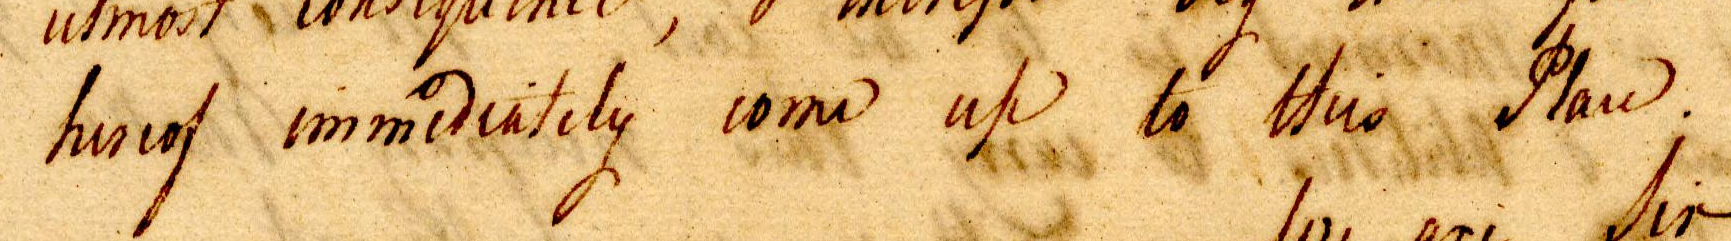hereof immediately come up to this Place.
